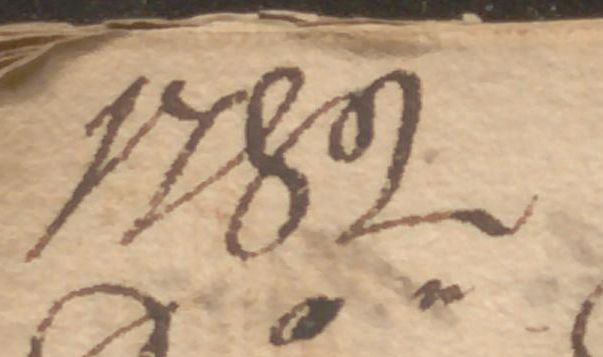1782
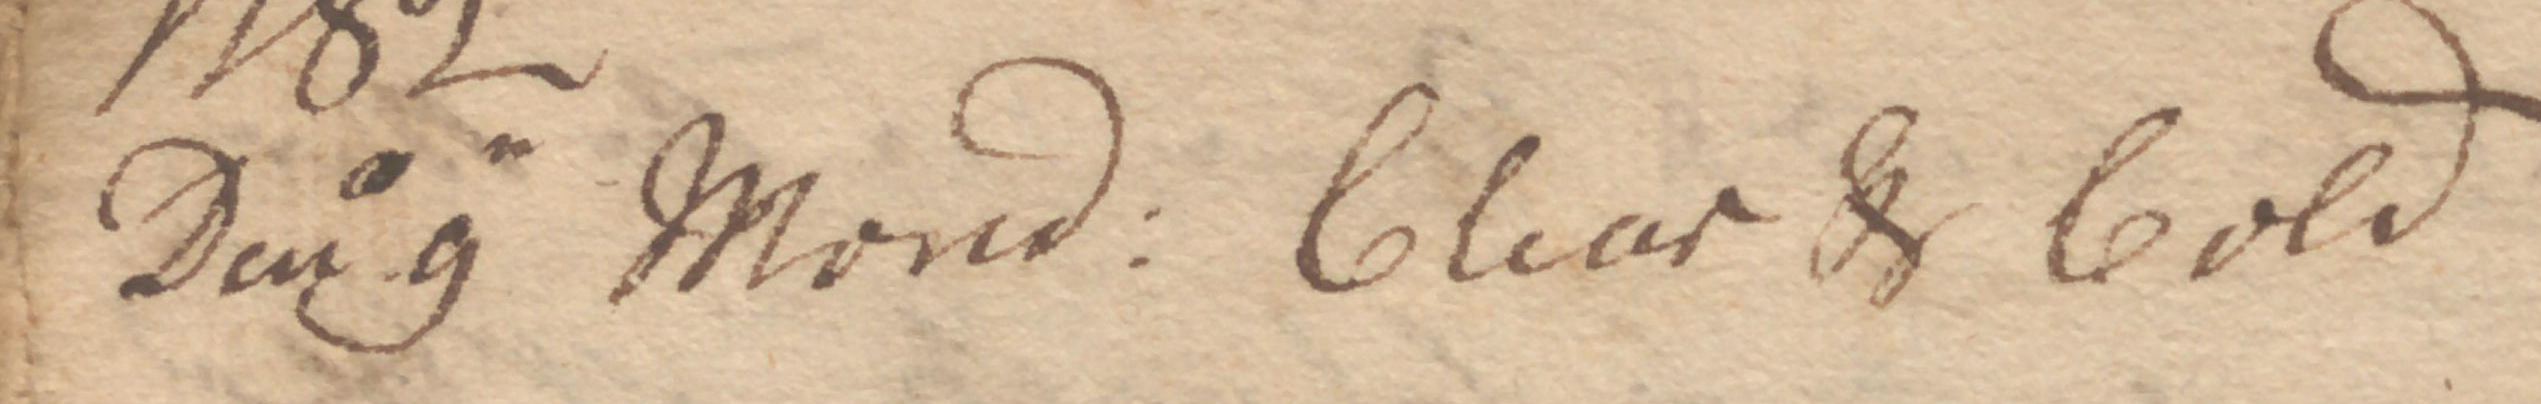Dec^r. 9 Mond: Clear & Cold
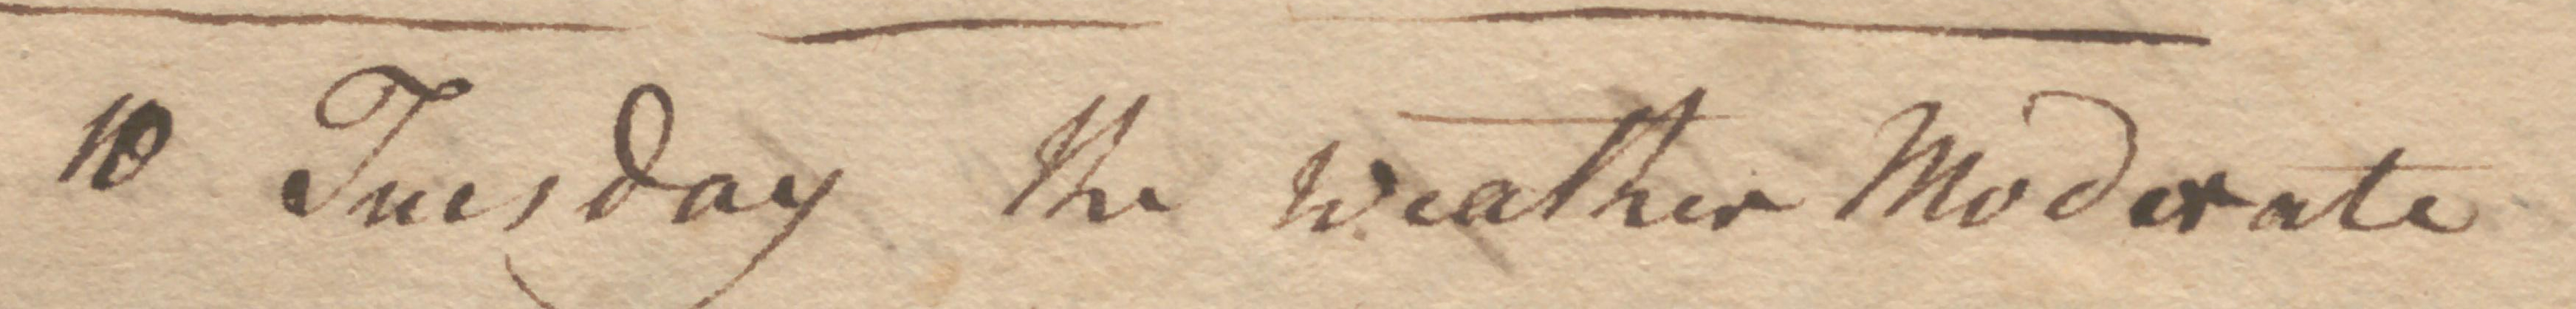10 Tuesday the Weather Moderate
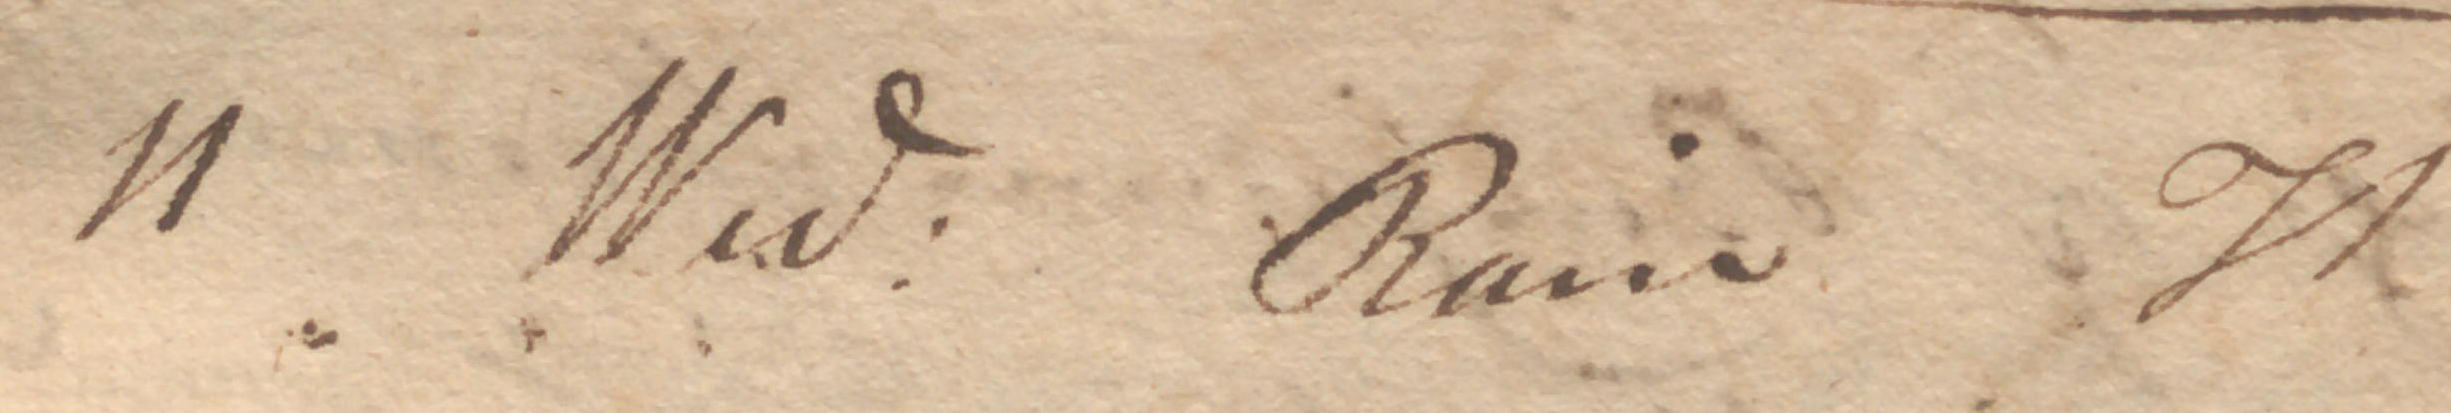11 Wed. Rain H
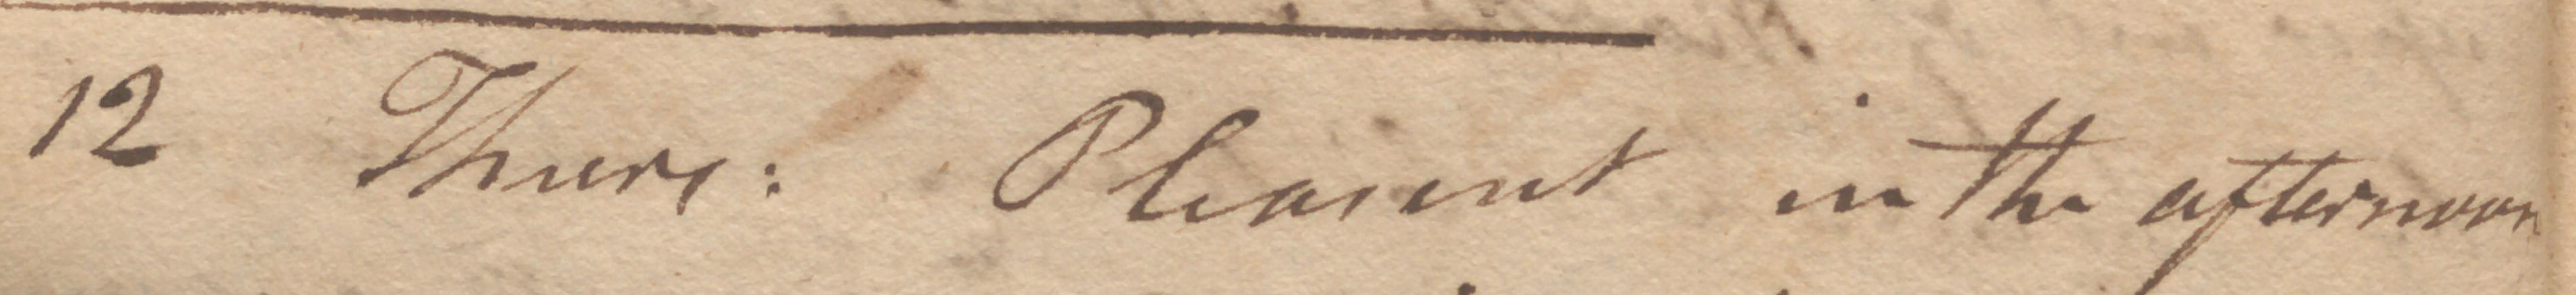12 Thurs. Pleasent in the afternoon
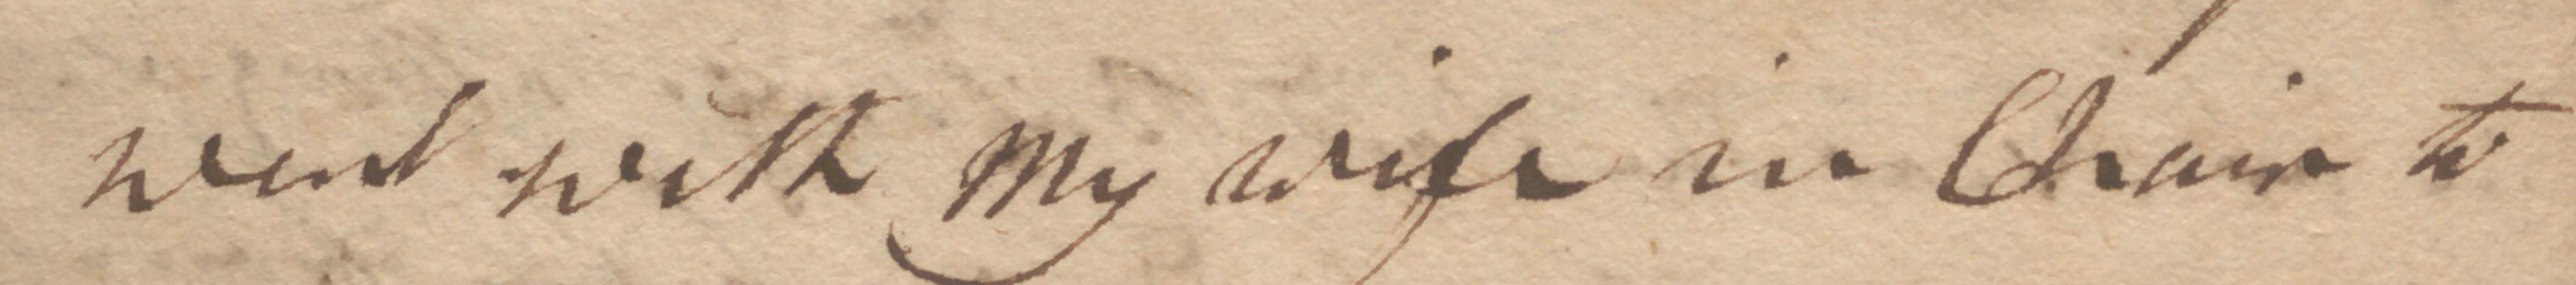went with My wife in Chair to
